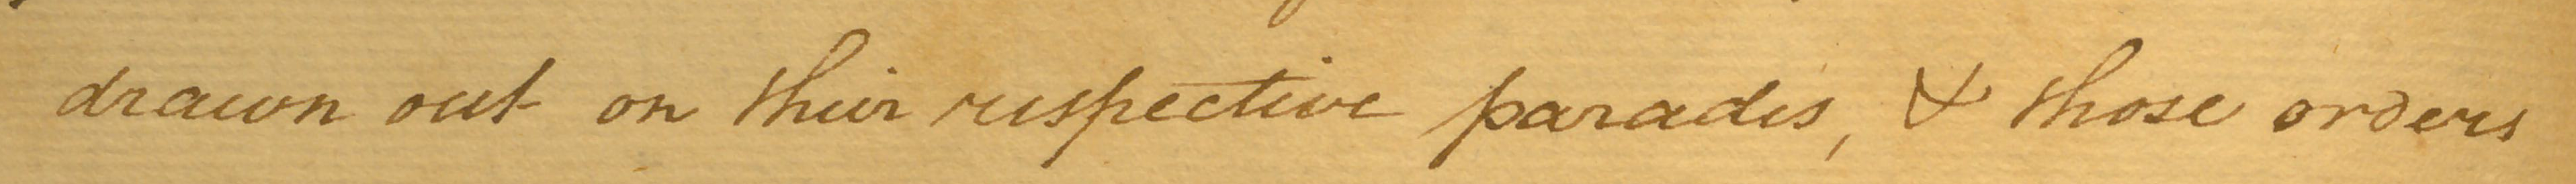drawn out on their respective parades, & those orders
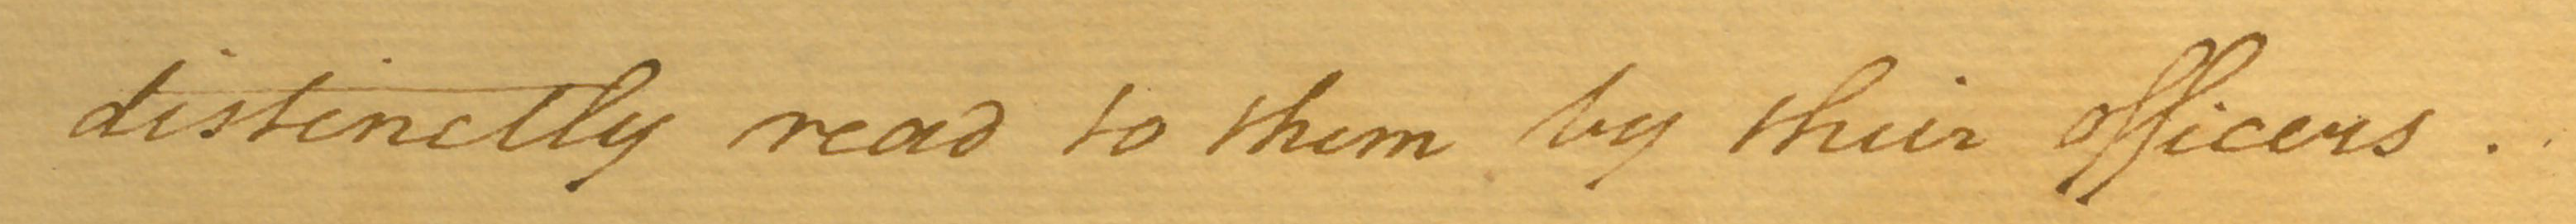distinctly read to them by their officers.
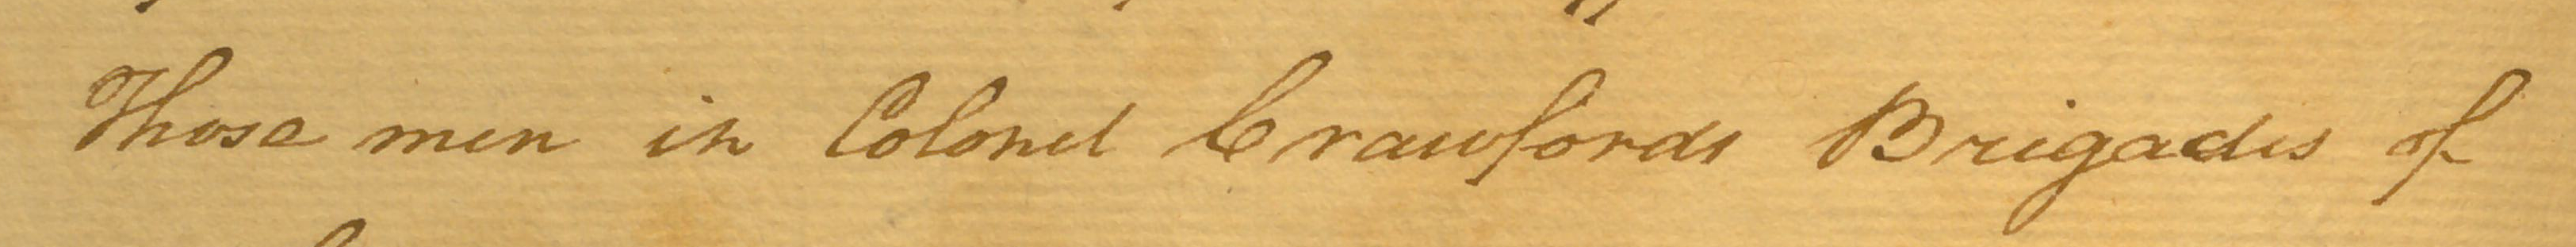Those men in Colonel Crawfords Brigades of
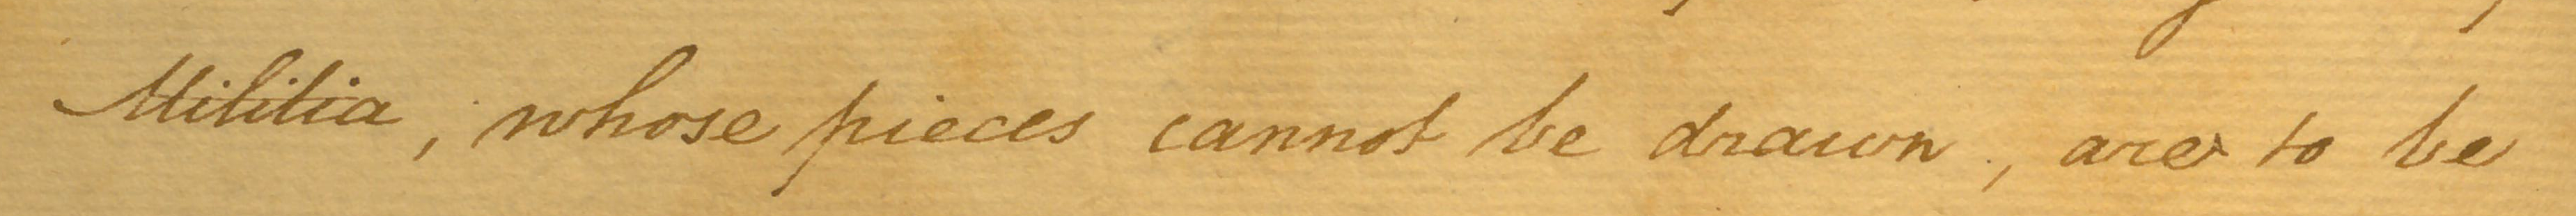Militia, whose pieces cannot be drawn, are to be
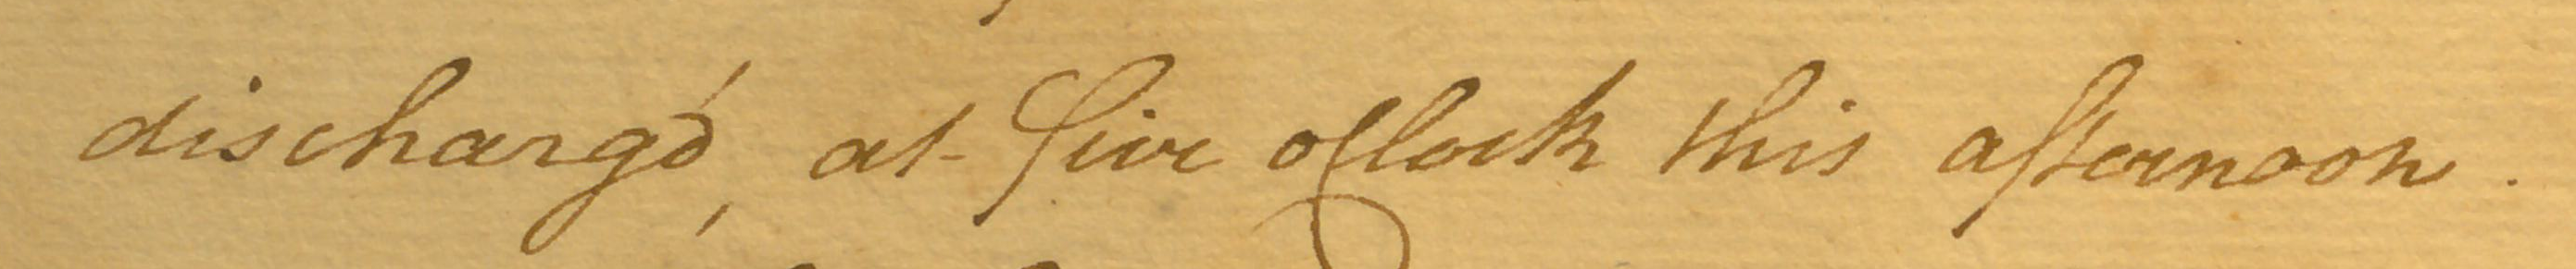discharg'd at five oClock this afternoon.
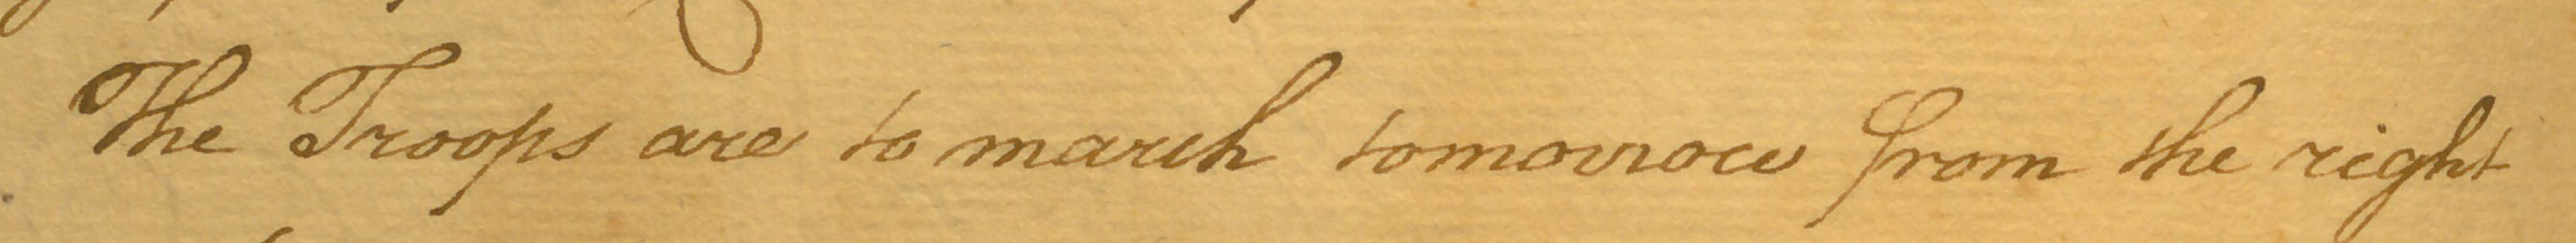The Troops are to march tomorrow from the right
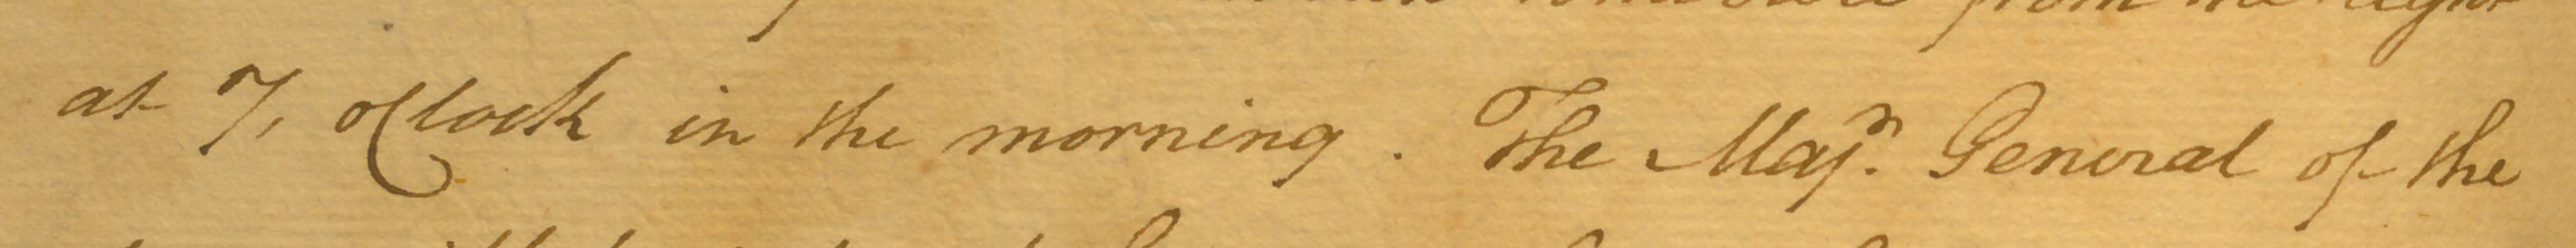at 7, oClock in the morning. The Maj^r. General of the
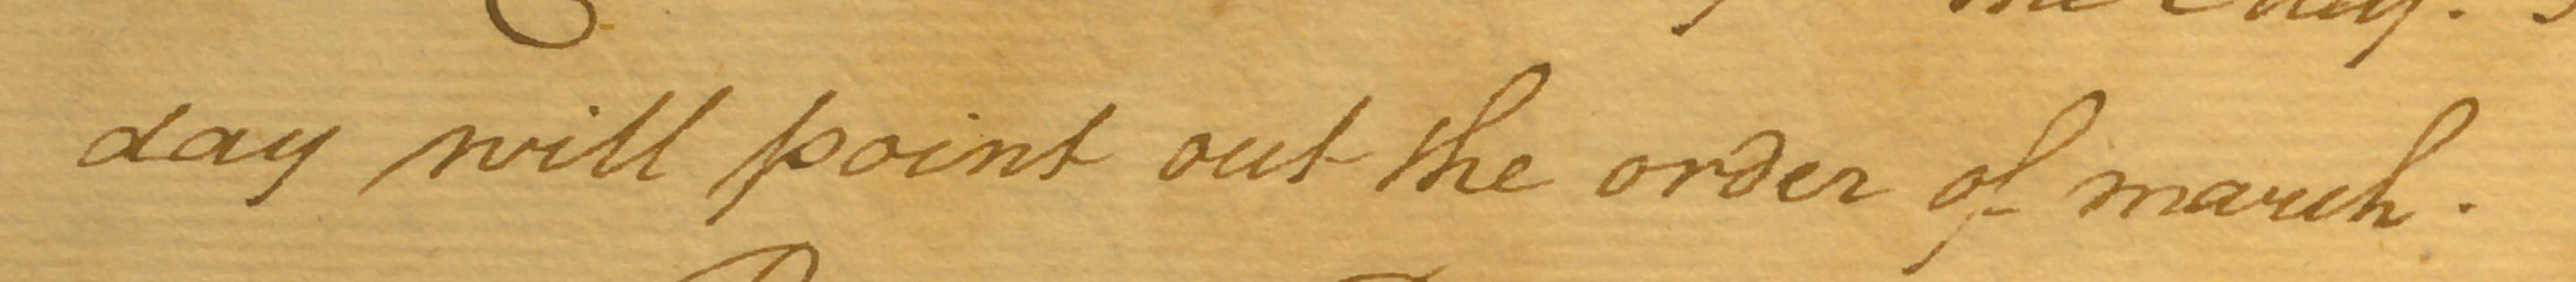day will point out the order of march.
